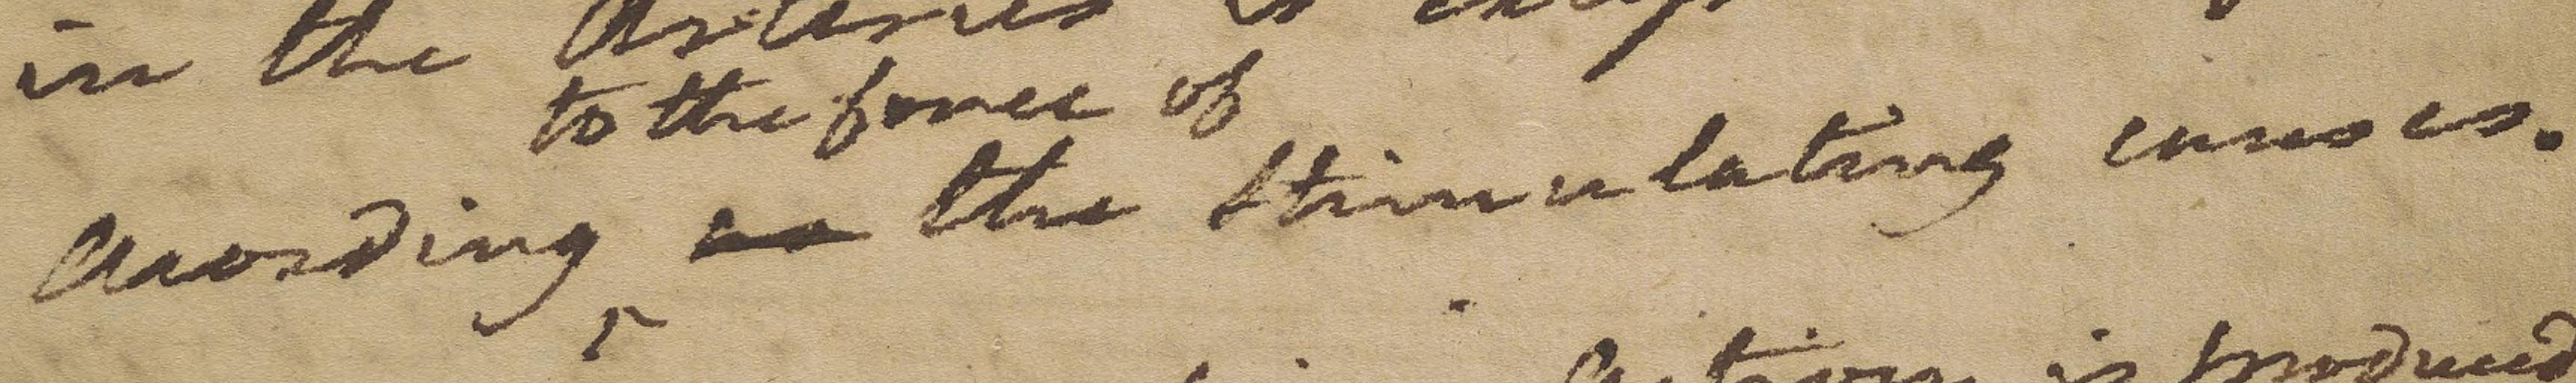according ^ the stimulating causes
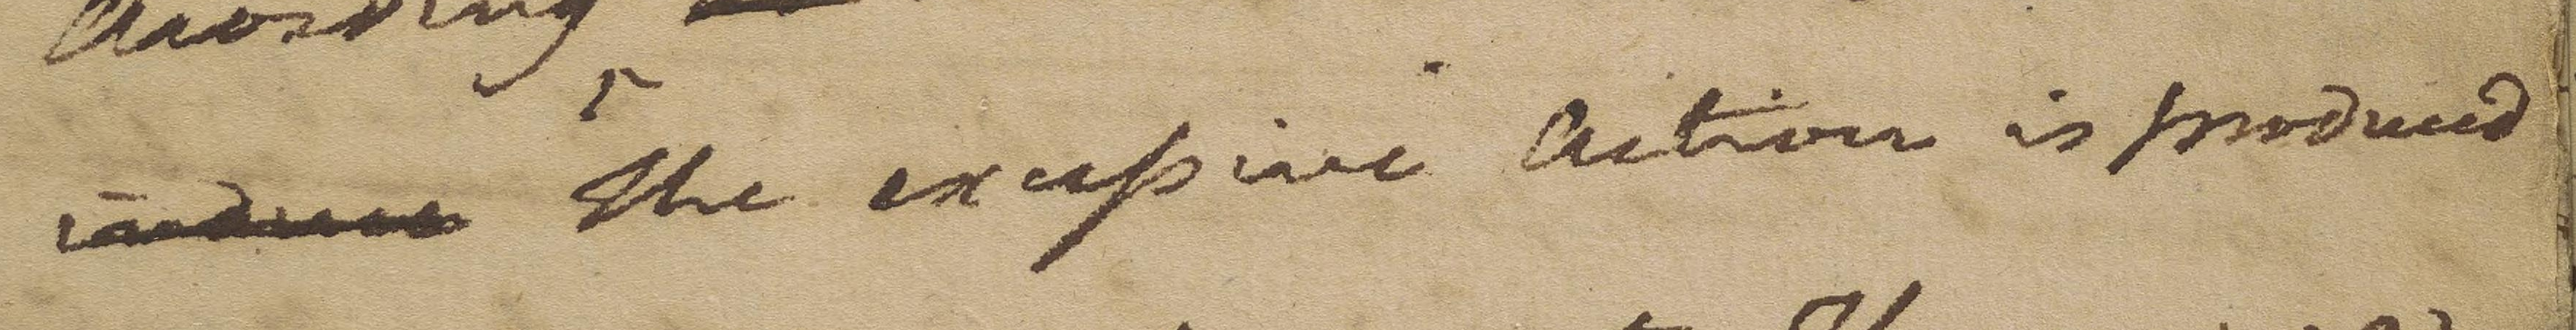[______] The excessive action is produced
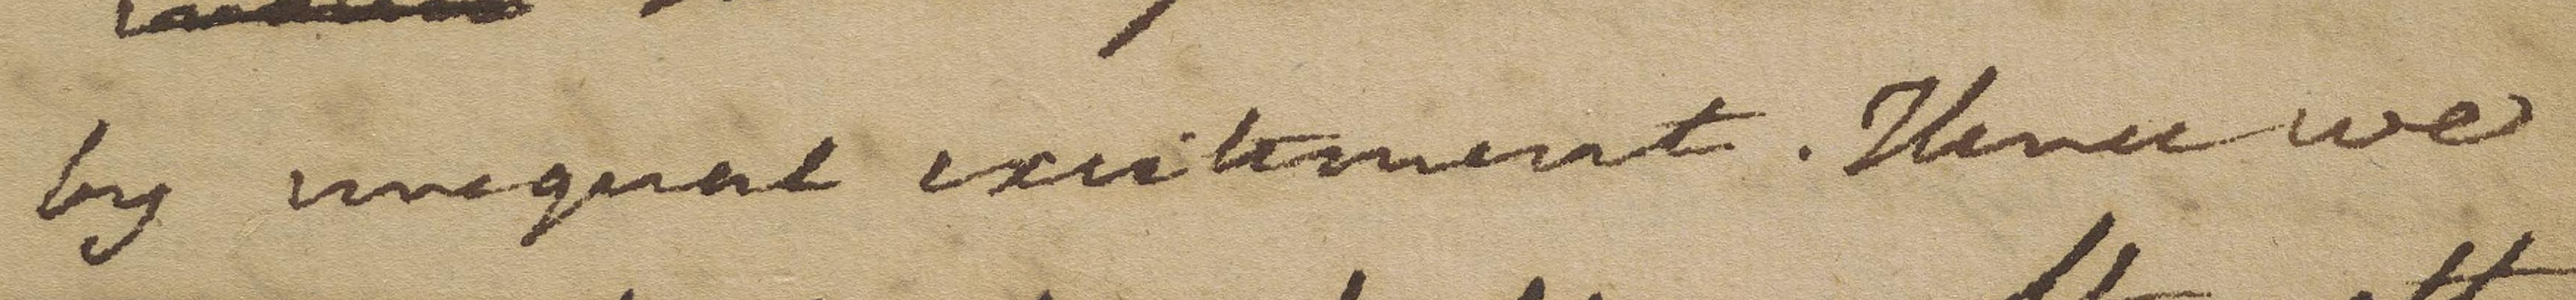by unequal excitement. Hence we
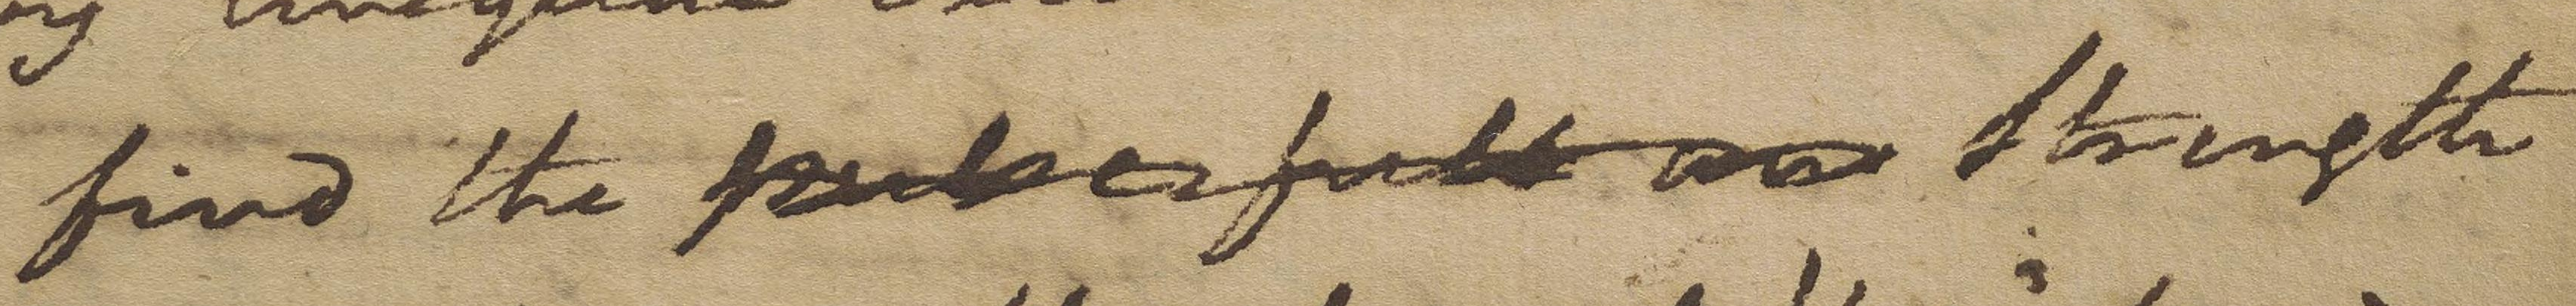find the [pulse full an] strength
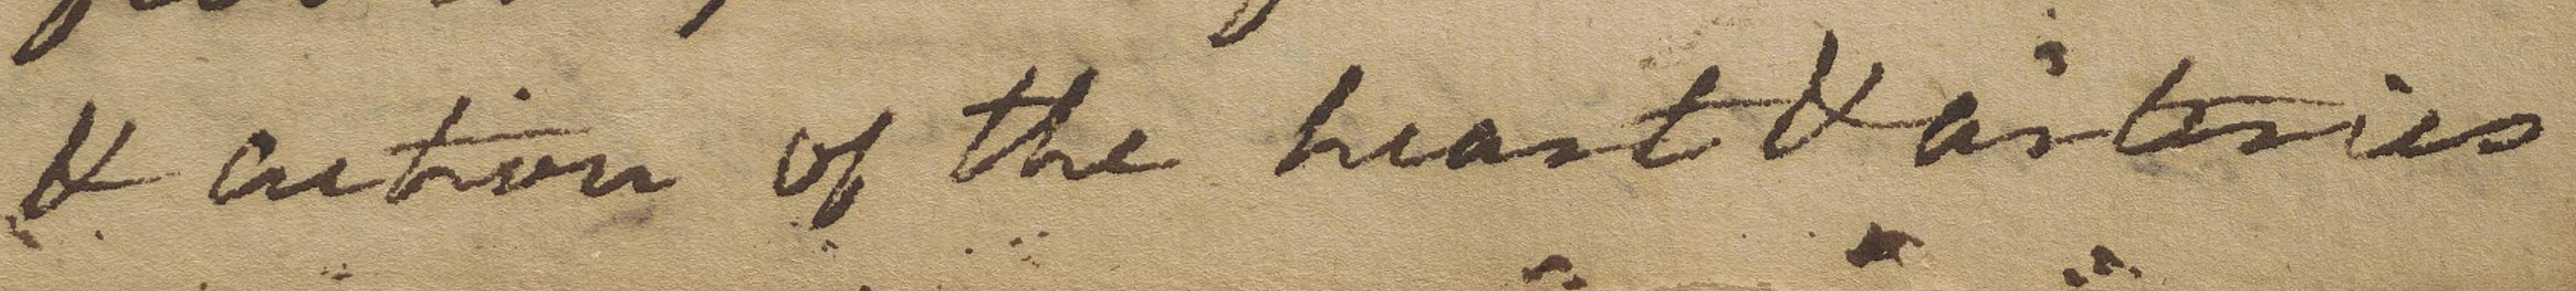& action of the heart & arteries
